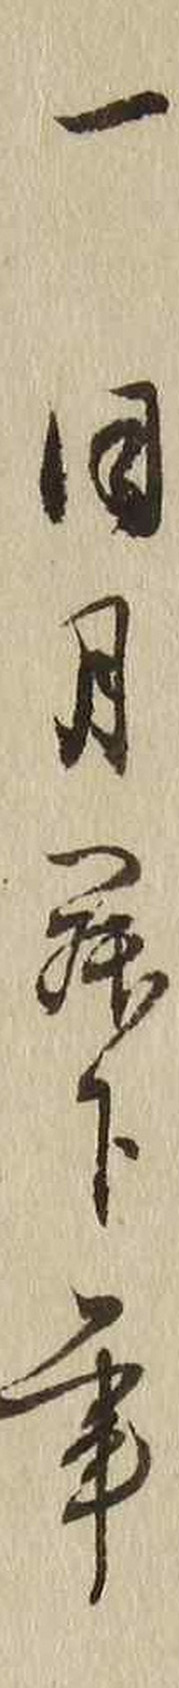一同月罷下候事
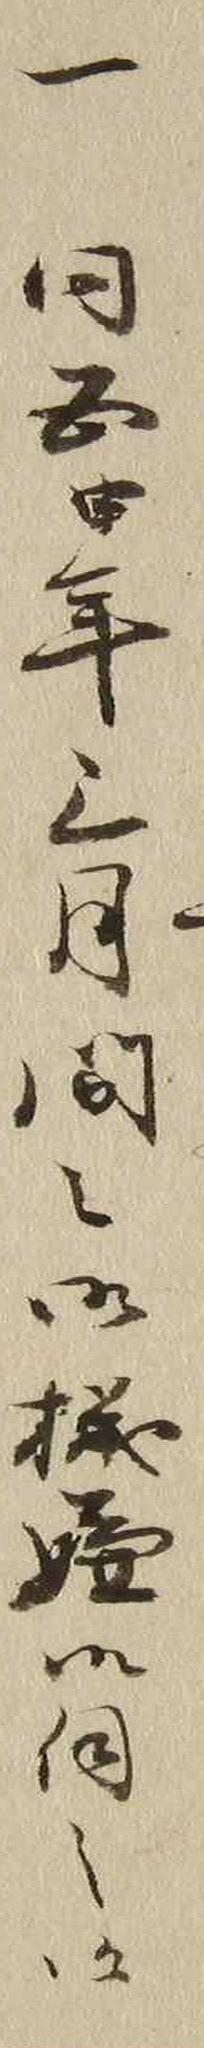一同五申年三月間之御機嫌御伺之御
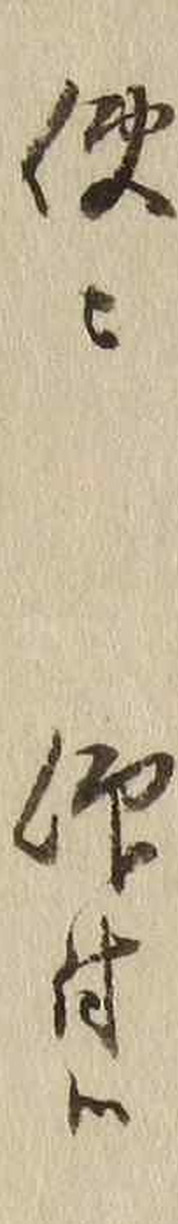使被仰付候
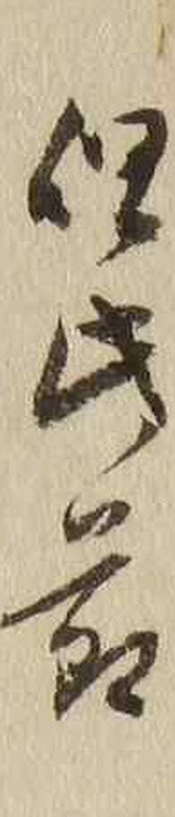但此節
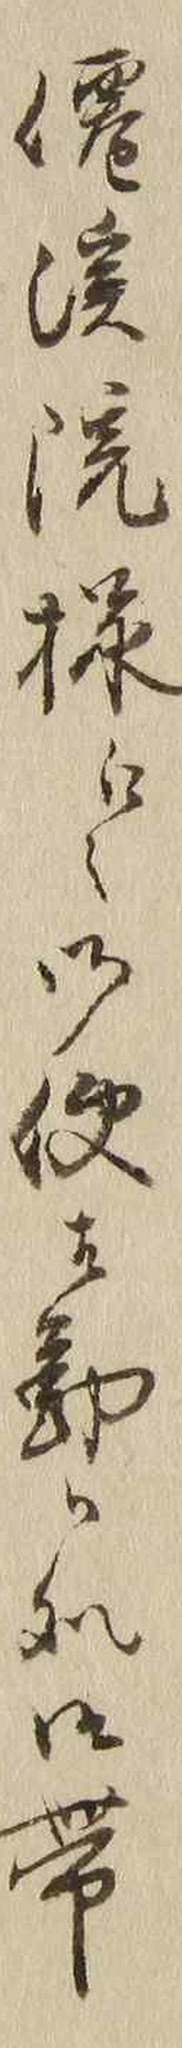僊渓院様江之御使相勤候処御帯
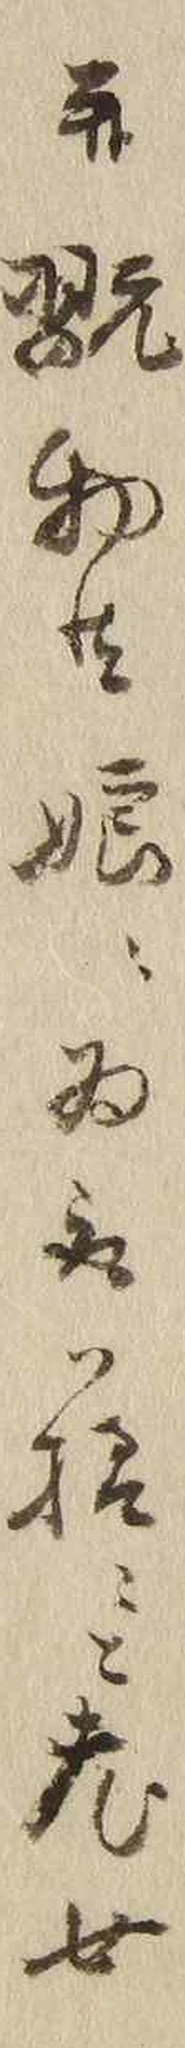并翫物共娘ニ為取候様ニと老女
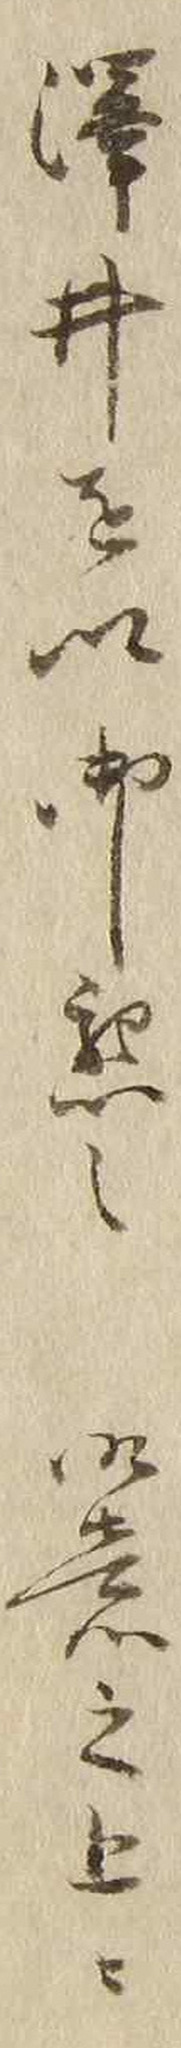沢井を以御懇之御意之上被
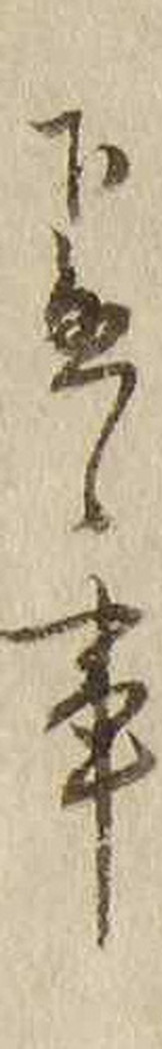下置候事
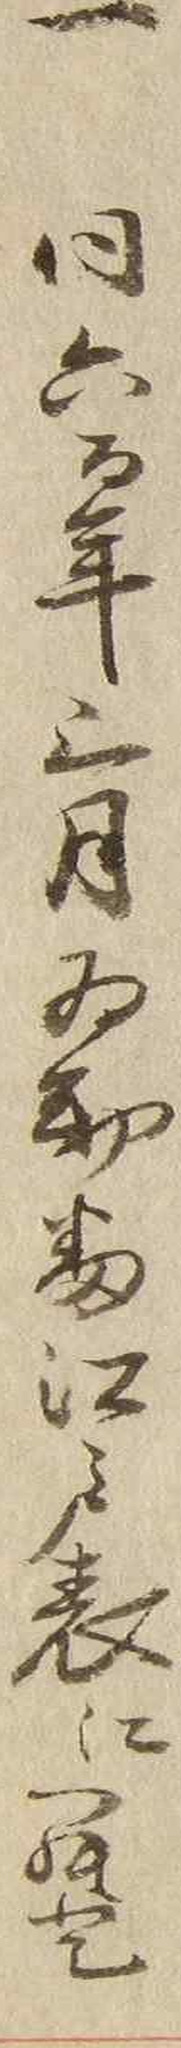一同六酉年三月為勤番江戸表江罷登

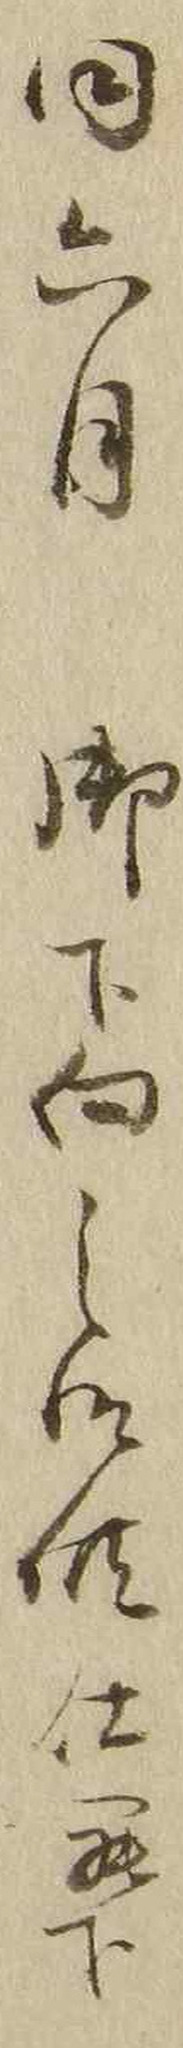同六月御下向之御供仕罷下
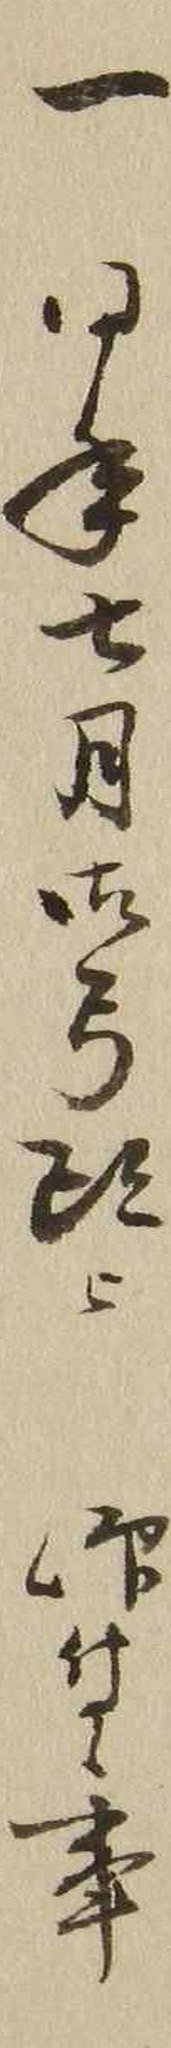一同年七月御弓頭被仰付候事
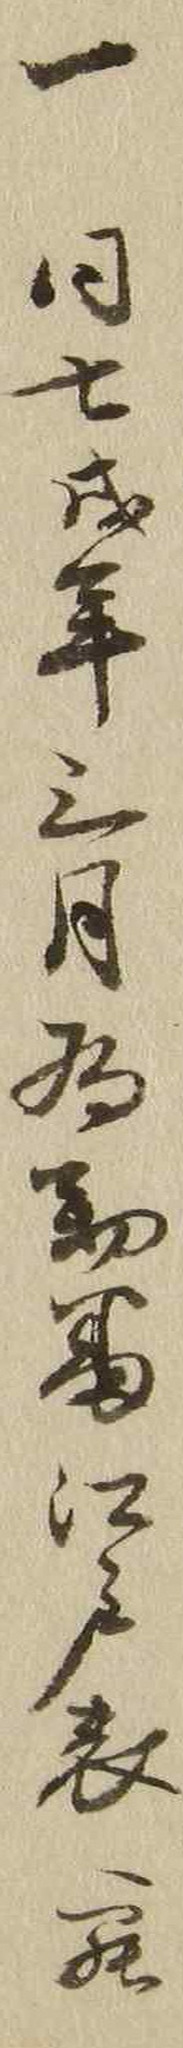一同七戌年三月為勤番江戸表へ罷
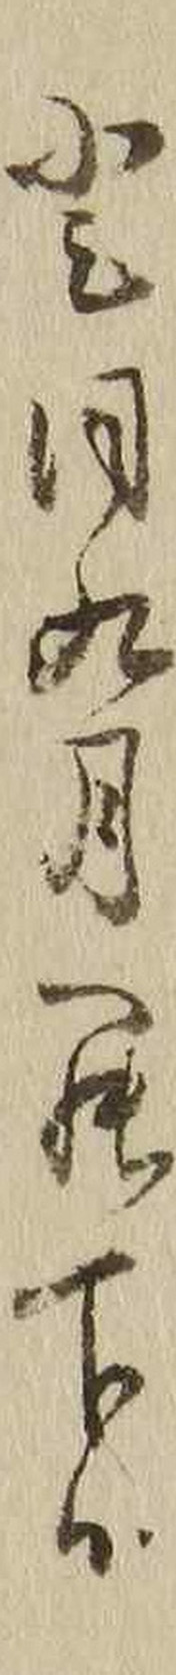登同九月罷下候
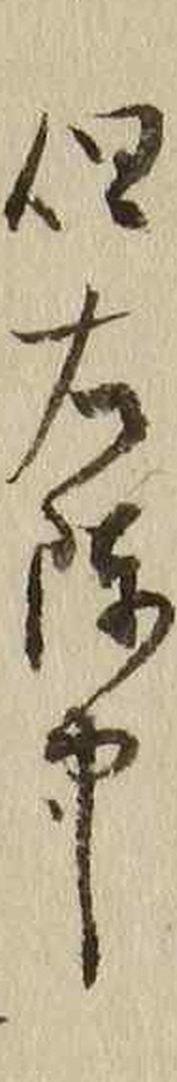但右陣中
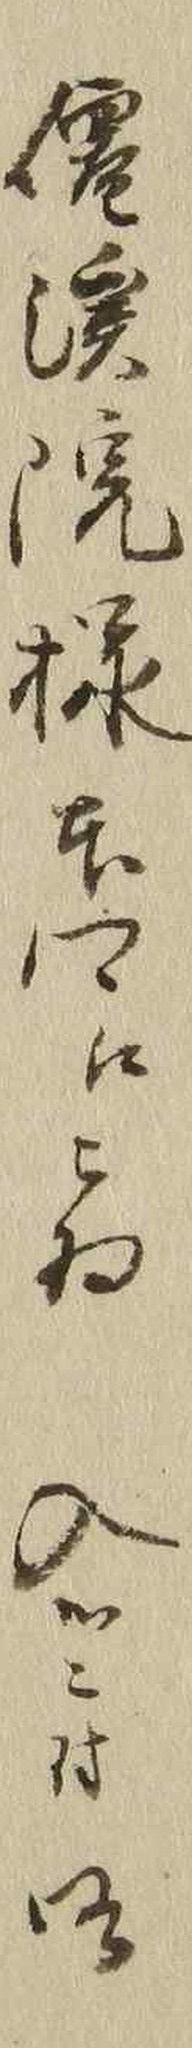仙渓院様本郷江被為入候ニ付御
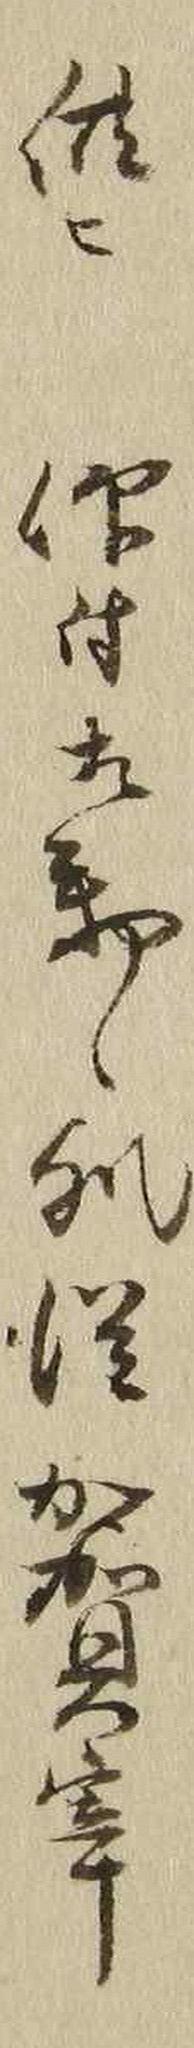供被仰付相勤候処従加賀宰
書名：諸士系譜　巻之225　ま之部6
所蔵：会津若松市立会津図書館
